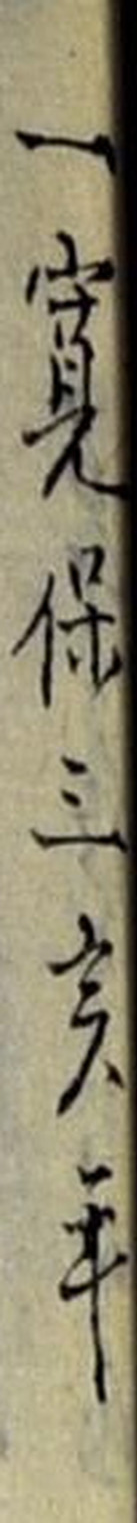一寛保三亥年
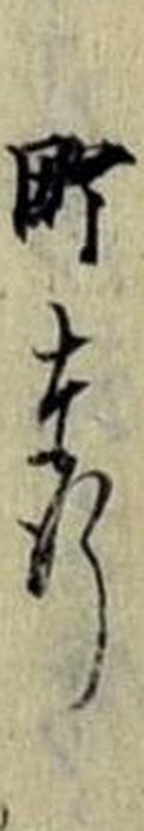町奉行
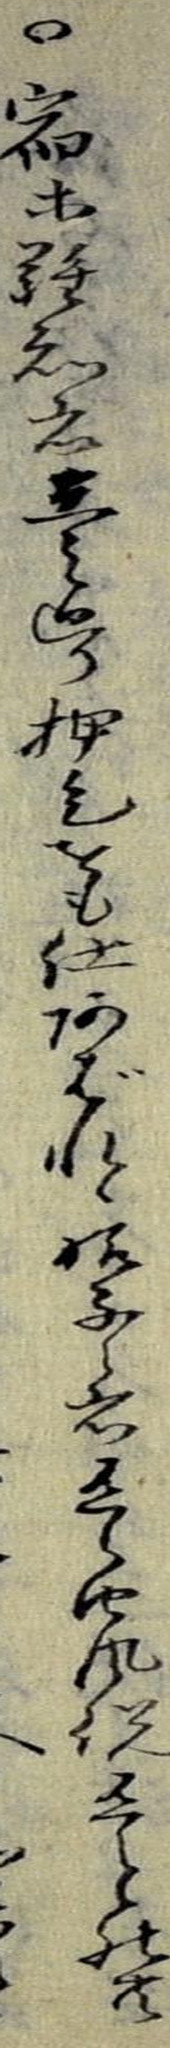〇宿等難知者在々へ廻り押乞をも仕あばれ候様子之者有之由風説有之候然共
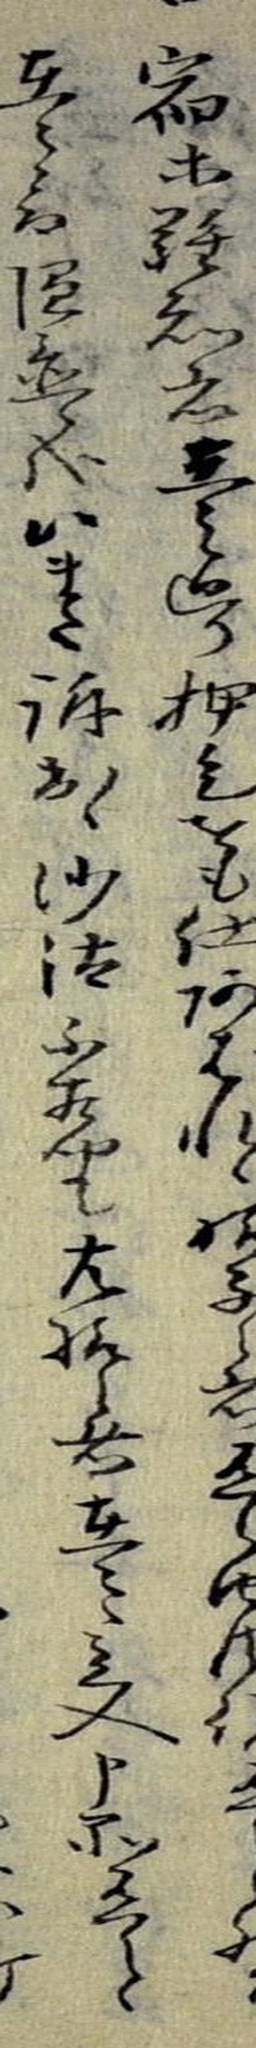在々ニ而隠置候哉いまた訴出候沙汰不相聞候左様之者在々へ立入申品有之候
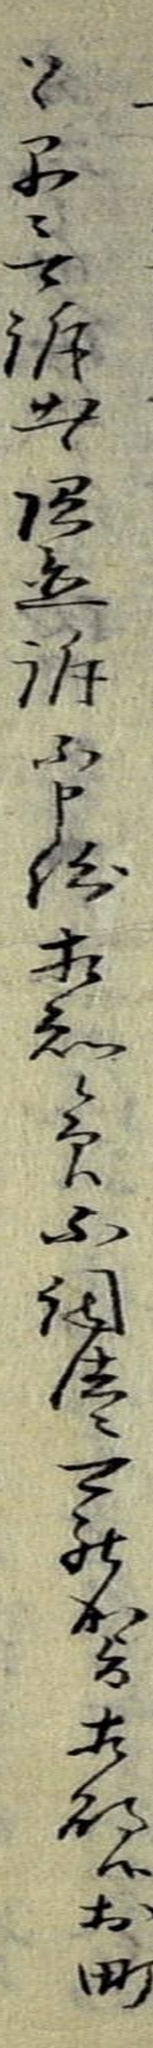ハヽ早々可訴出候隠置訴不申儀相知候而ハ不調法ニ可罷成旨相触候於町
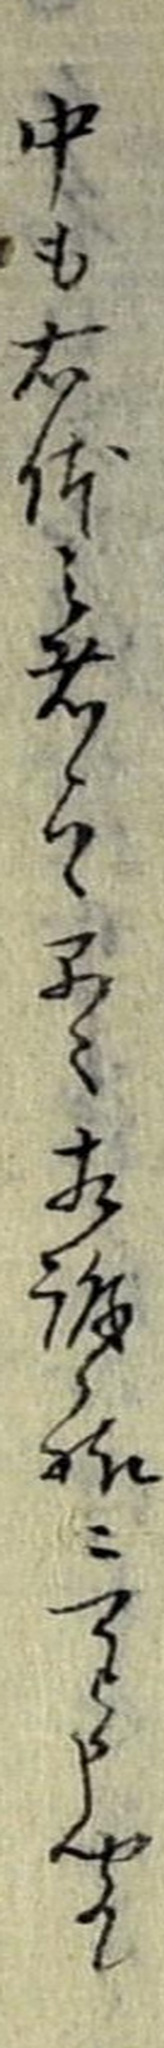中も右体之者候ハヽ早々相訴候様ニ可被申聞候
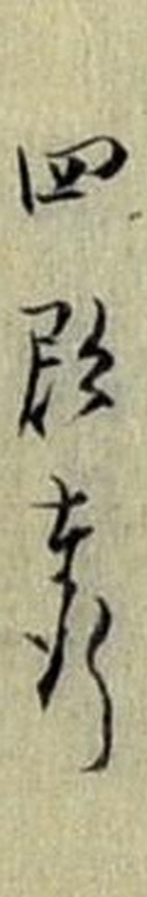四郡奉行
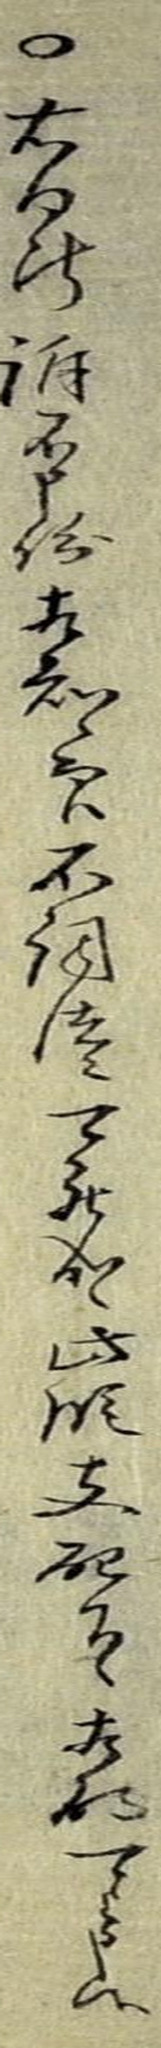〇右同断訴不申儀相知候而ハ不調法ニ可罷成候此段支配下へ相触可被申候
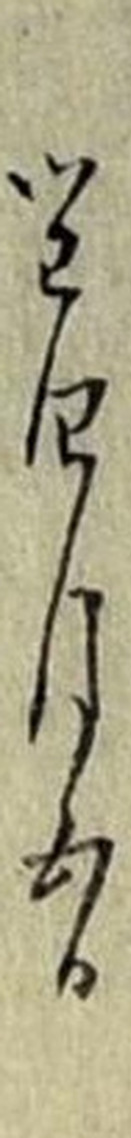閏四月五日
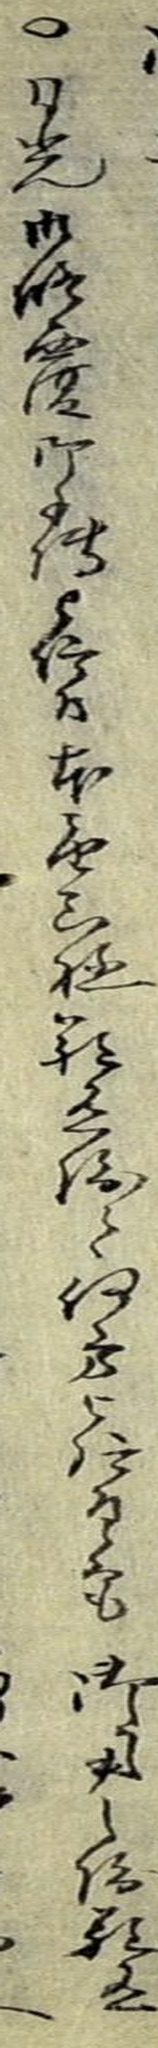〇日光御修覆御手伝被仰付本望至極難有儀ニ候何方被仰付候而も御用之儀難有
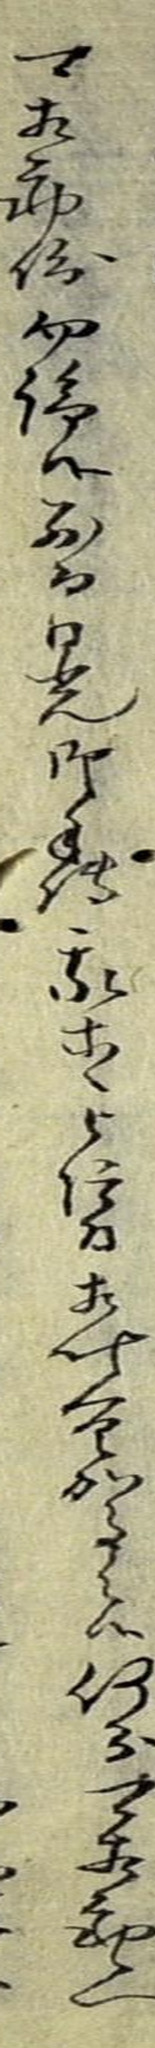可相勤儀勿論候別而日光御手伝我等へ被仰付相叶冥加事ニ候何分可相勤候へ
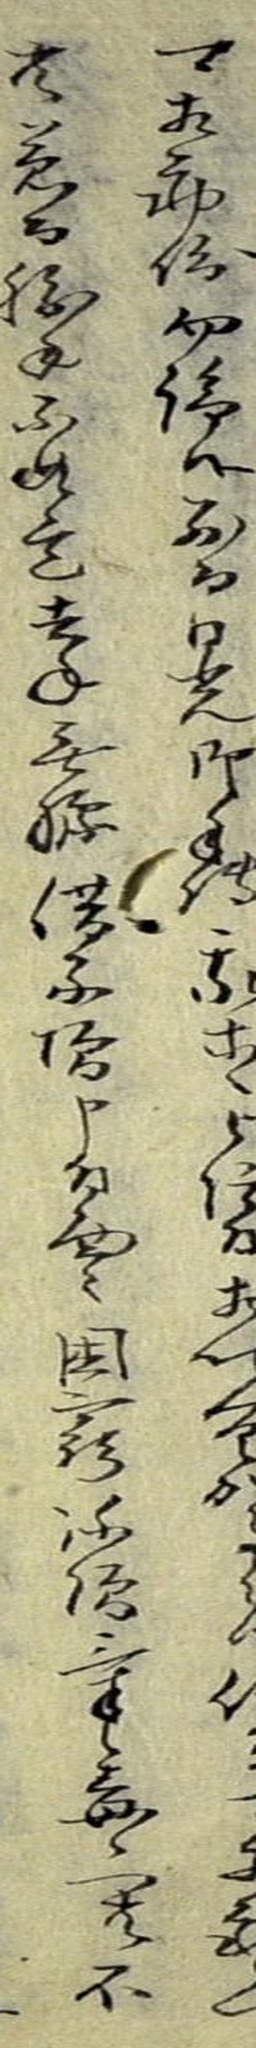共兼而勝手不如意去年無拠借米増申付面々困窮弥増気之毒候へ共不
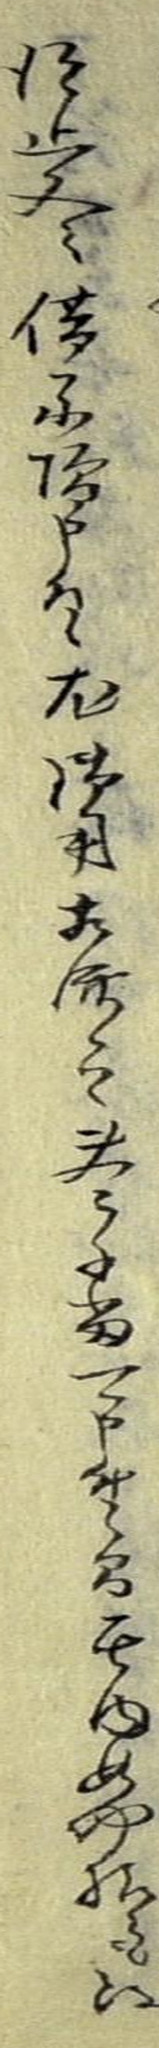得止又々借米増申付候尤御用相済候ハヽ夫々手当可申付候間其内如何様ニも致

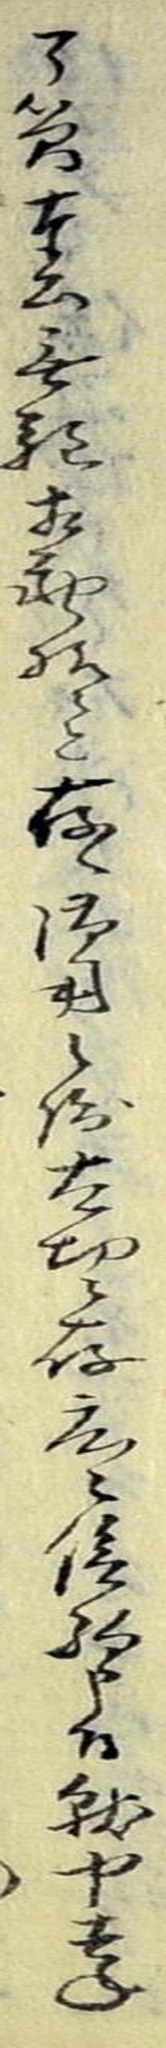了簡奉公無難相勤候ニと存候御用之儀太切ニ存度々倹約申付就中去年
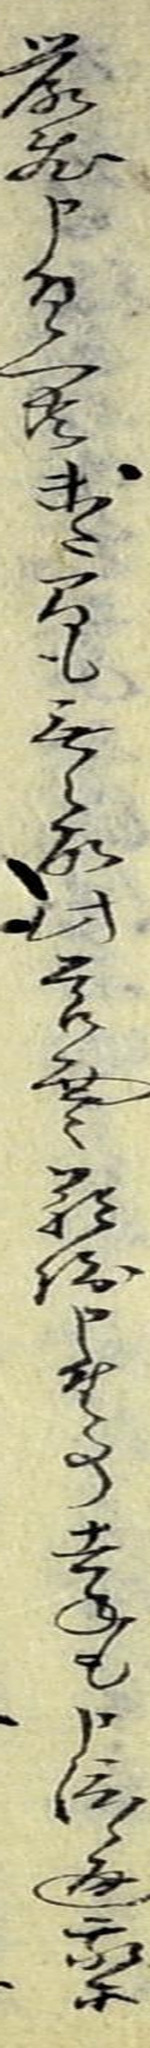厳敷申付候へ共未た間も無之故此節面々難儀申付候事去年も申渡候通我等
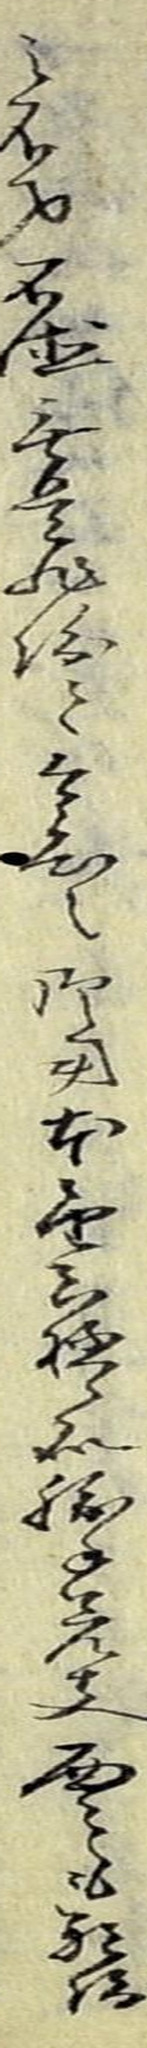之不才不徳無是非儀ニ候今度之御用本望至極候処勝手差支面々へも難儀
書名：命令之部 一
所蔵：福井県文書館 Fukui Prefectural Archives
